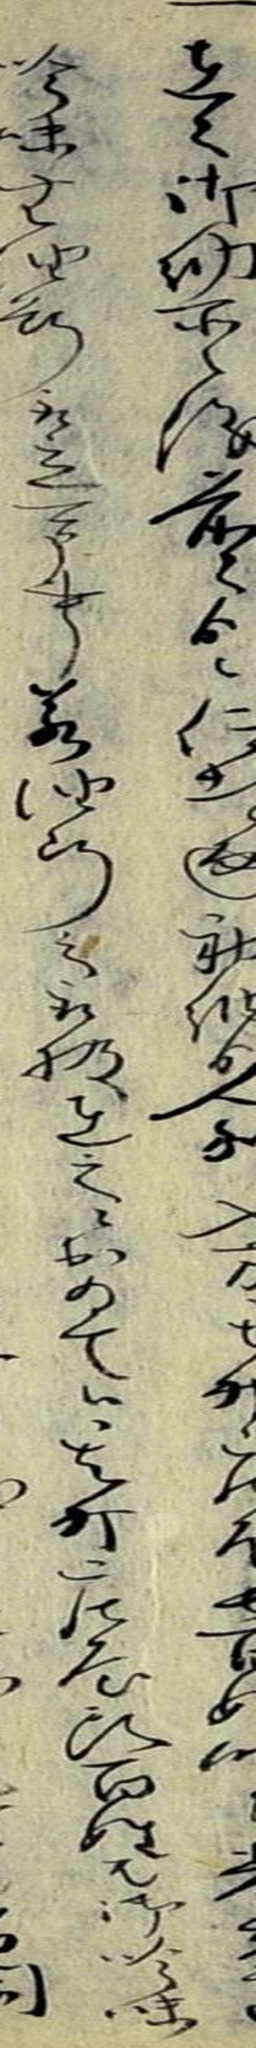吟味無油断取立可申事若油断之取扱在之におゐては其村庄屋頭百姓共吟味
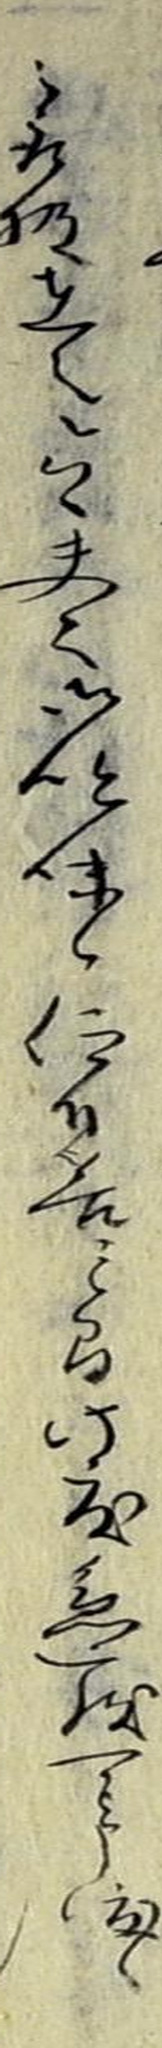之取扱在之候はゝ夫々御吟味被仰付筈に候間此度急度可被申渡候
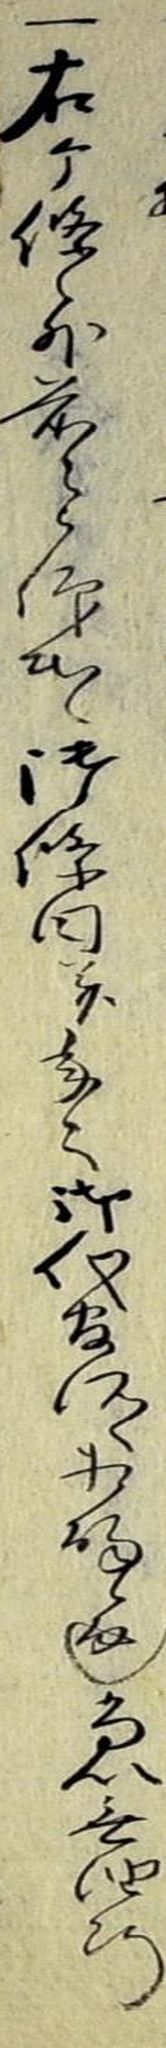一右ケ条之外前々被仰出候御条目并年々御代官所へ相触候通尚以無油断
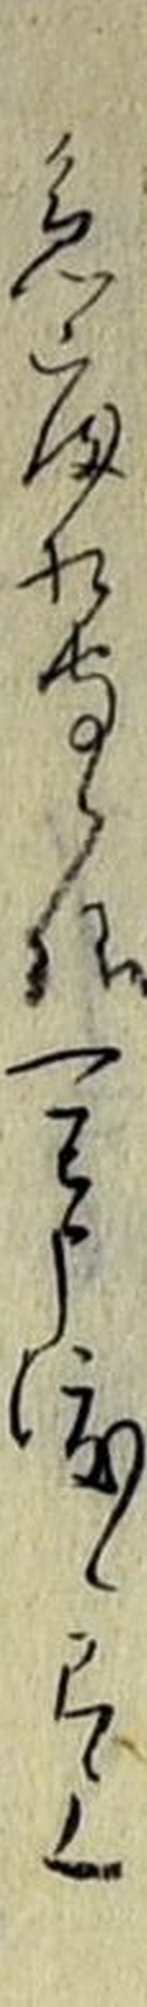急度相守候様可被申渡候已上
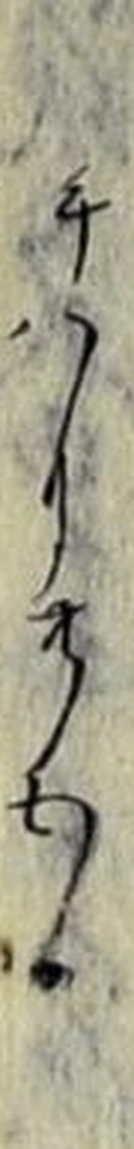午八月廿五日
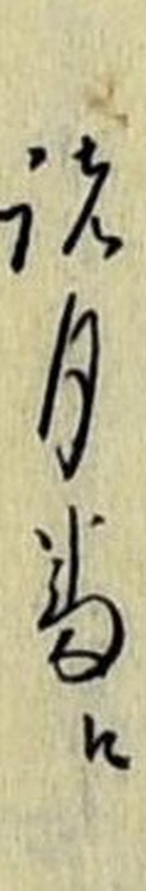諸月番え
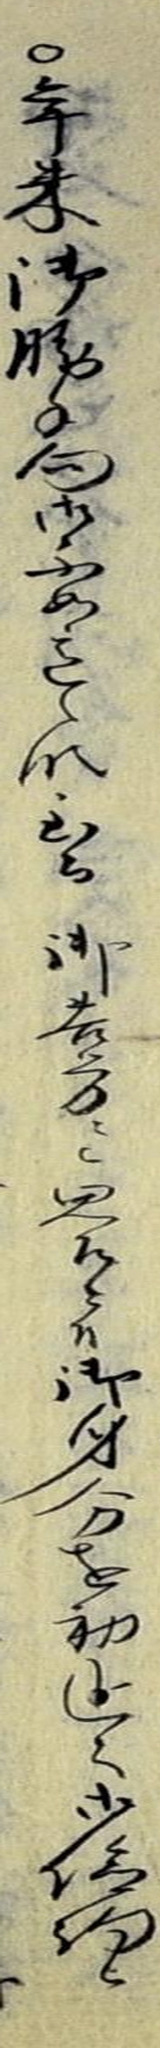〇年来御勝手向御不如意之段至而御苦労に被思召に付御身分を初追々御倹約被
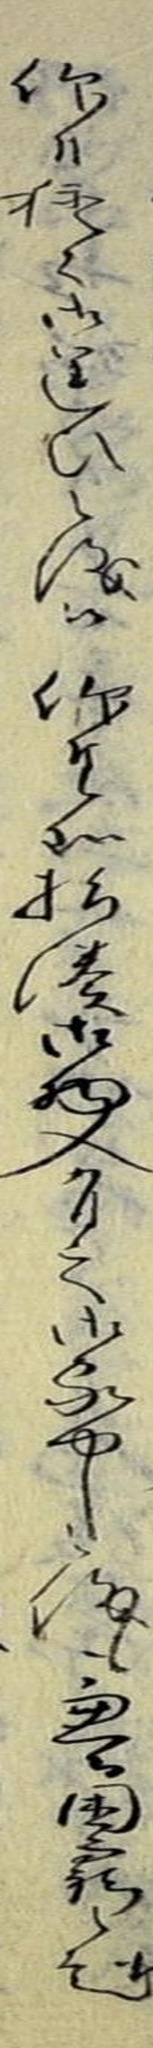仰付種々御運ひ之儀被仰付候処指湊御物入有之御家中之儀も兼而困窮之趣
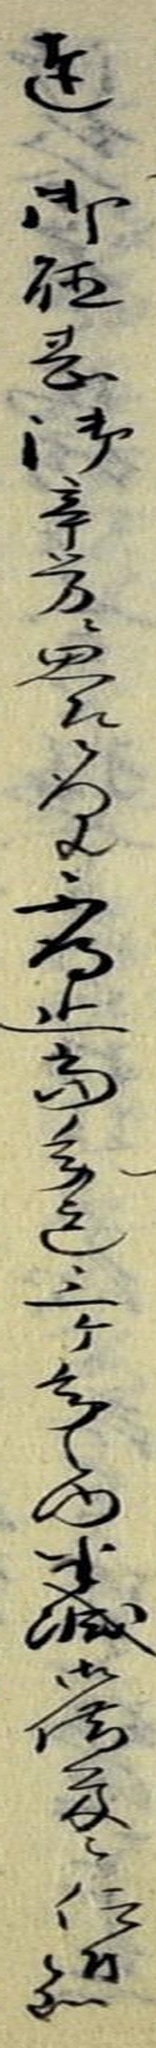達御聴甚御辛労に思召候得共不得止当年迄三ケ年之内半減御借米被仰付候処
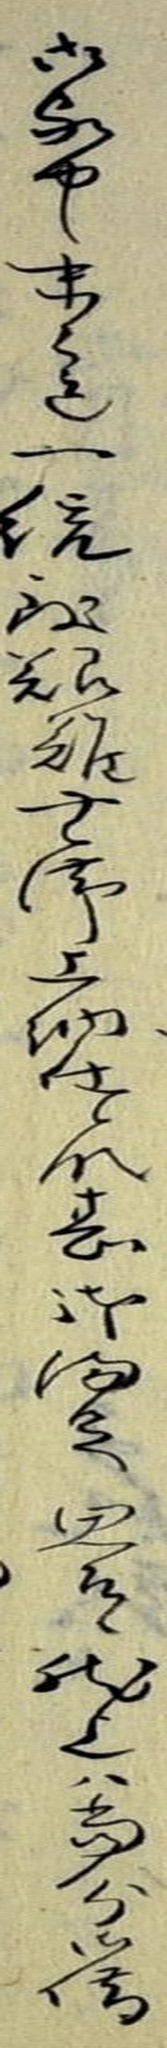御家中末々迄一統致艱難無滞上納仕候段甚御満足思召候然上は当分御借
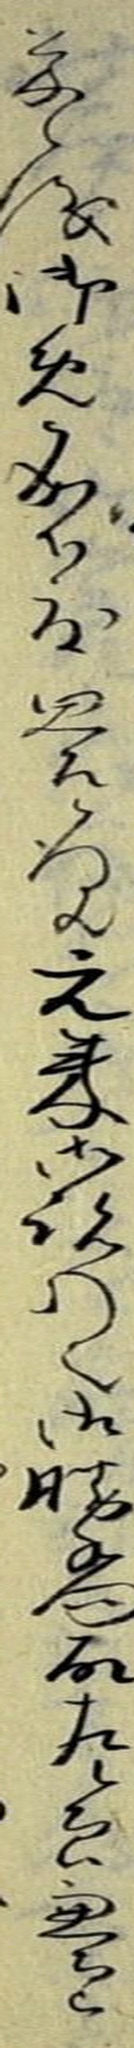米之儀御免被成下度思召候得共元来御跡引之御勝手向故左候而は兼而被
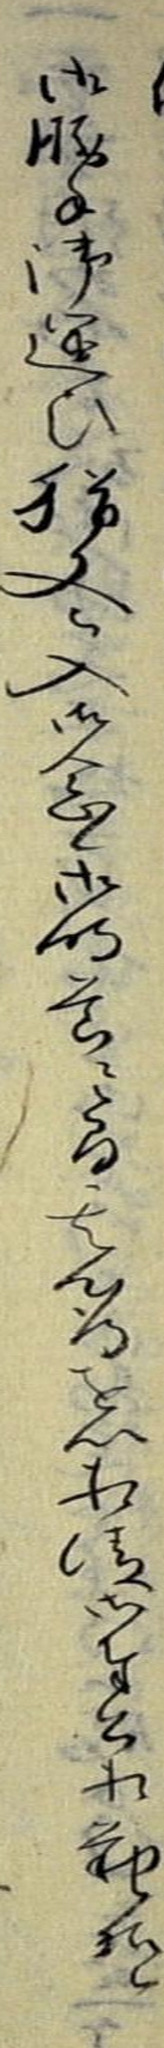御勝手御運ひ尚猶又被入御念候御時節に候間其心得を以相請御奉公相勤候様被
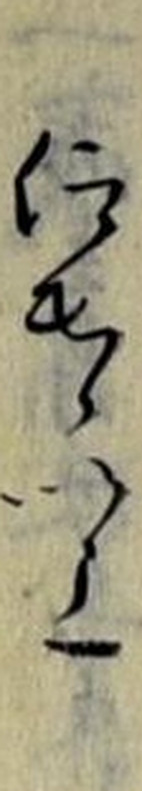仰出候以上
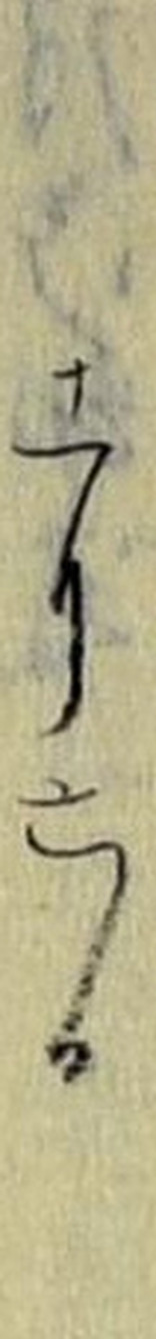十一月六日
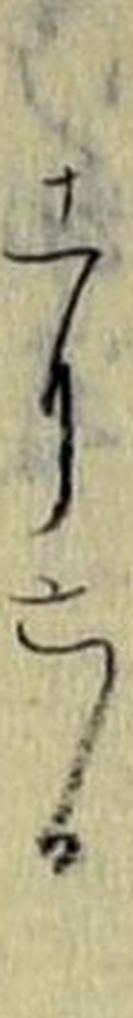十一月六日
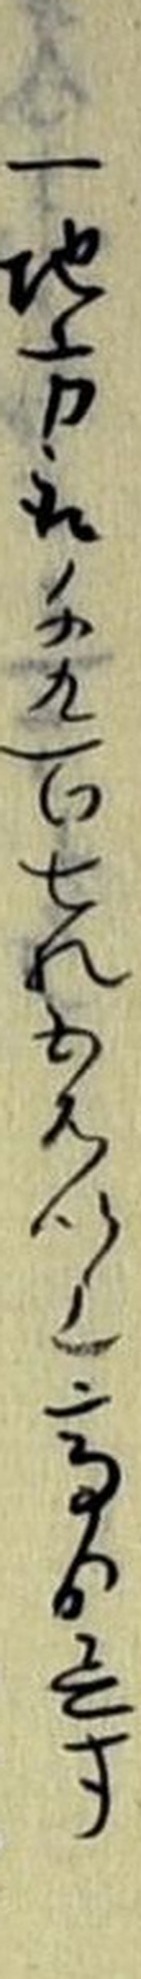一地方取千九百七拾五石以上高ゟ壱寸
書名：命令之部 二
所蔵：福井県文書館 Fukui Prefectural Archives
